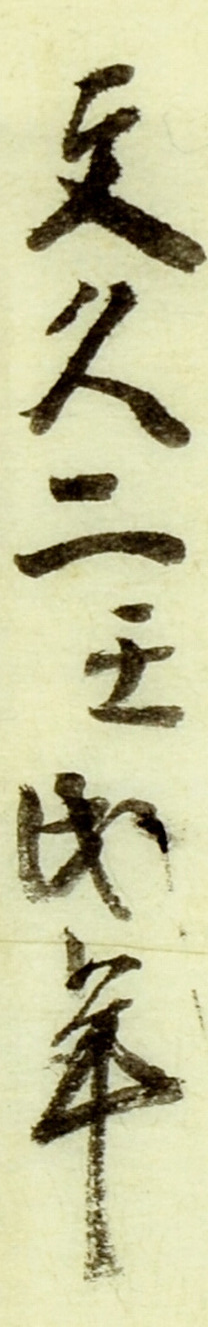文久二壬戌年
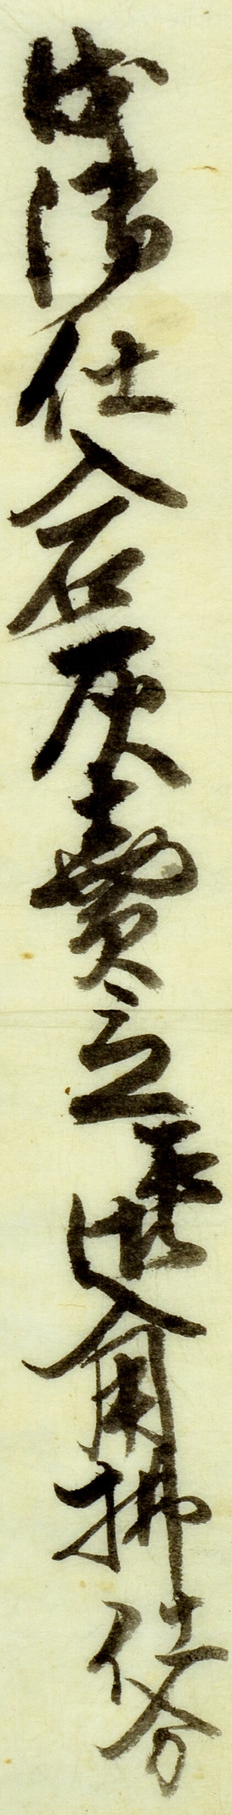戌御仕入石灰売立並御入用払仕分
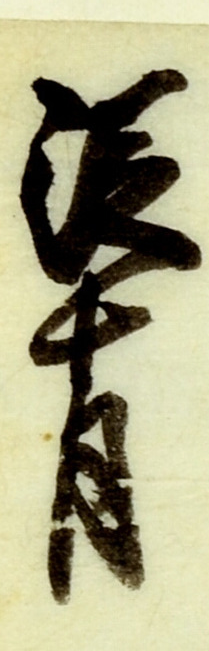従十月
